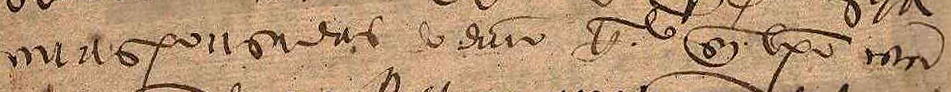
em as pousadas o dito Rdo s̄r bp̄o estā
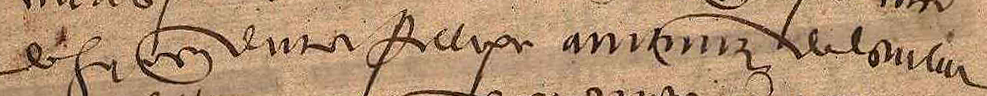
do hy o sōr doutor fellipe amtunez do desenbar
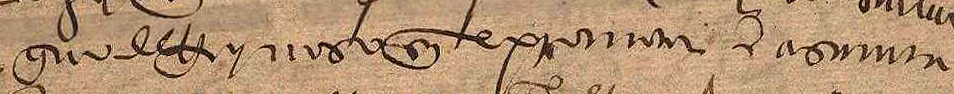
guo del Rey noso s̄r e promotor ē a samta
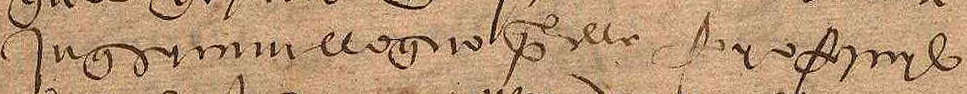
Jnq̄syçam lloguo p̄o elle foy oferecydo
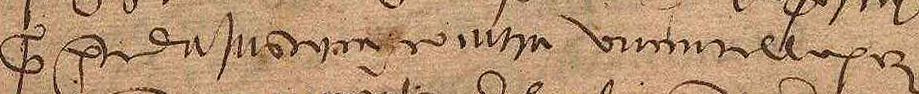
p̄o p̄te da Justyça comtra vicemte llopez
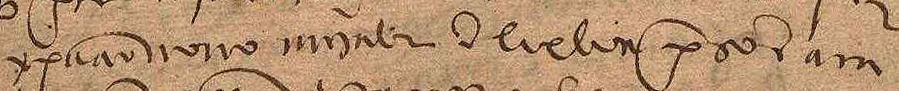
xpaão nouo morador ē lixboa p̄so ē a ca
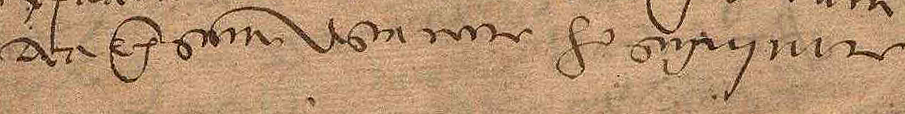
dea e p̄sam desta corte ho segujmte
